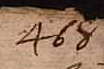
468
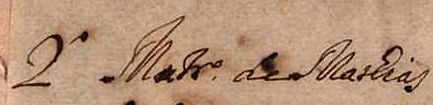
2o Matr.o de Mathias
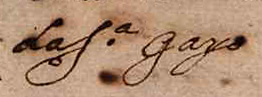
da S.a gayo
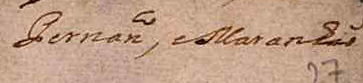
Pernanco, e Maranhaõ
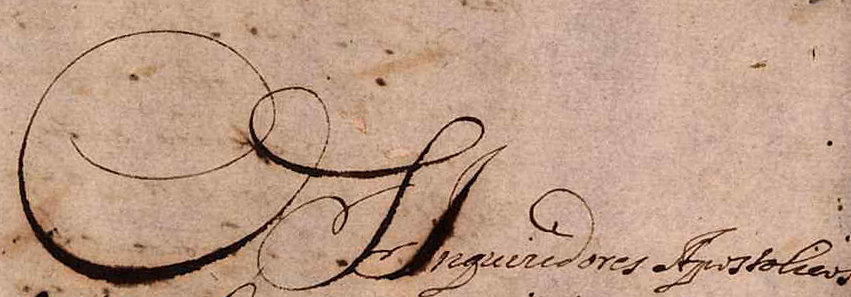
Os Inquizidores Apostolicos
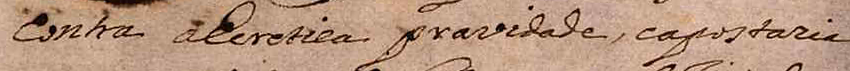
contra a heretica pravidade, e apostazia
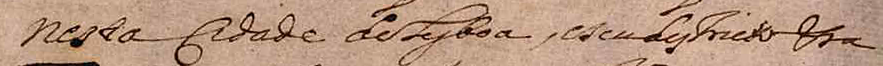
nesta Cidade de Lisboa, e seu destricto &ra
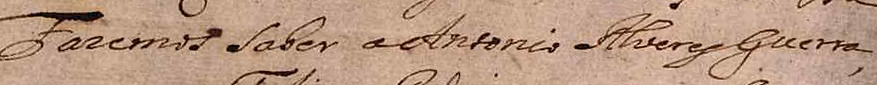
Fazemos saber a Antonio Alveres Guerra,
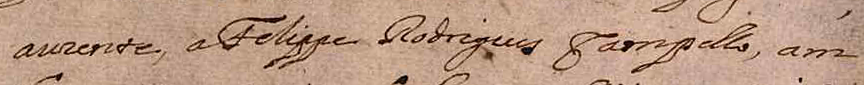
auzente, a Felippe Rodrigues Campello, am
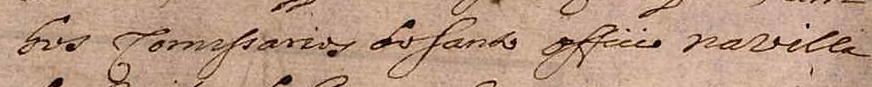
bos Comissarios do santo officio na villa
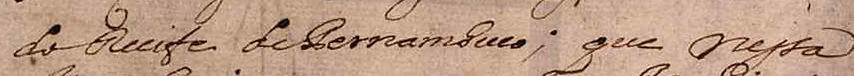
do Recife de Pernambuco; que nesta
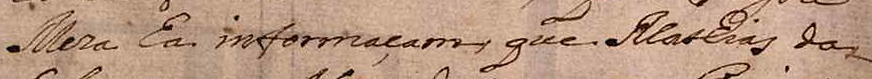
Meza ha informaçam, que Mathias da
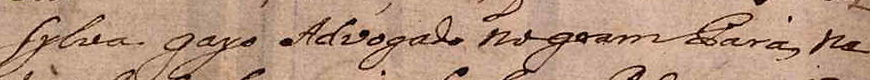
Sylva gayo Advogado no gram Pará, na
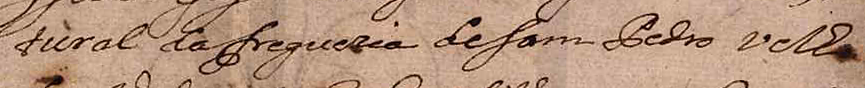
tural da freguezia de Sam Pedro velho
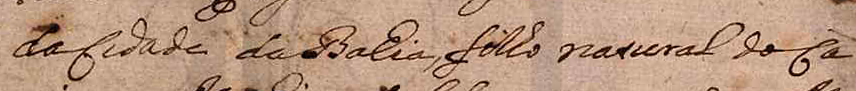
da Cidade da Bahia, filho natural do Ca
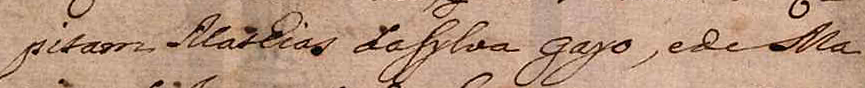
pitam Mathias da Sylva gayo, e de Ma
